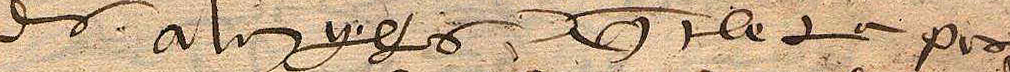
dos avangelhos ē q̄ ele ta pos
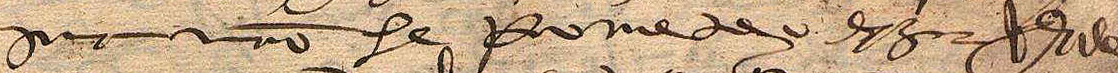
sua mão he prometeo dyzer ꝟdade
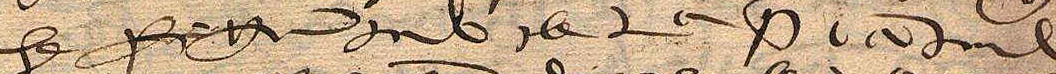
he pregūtado ele ta p̄o o cōteudo
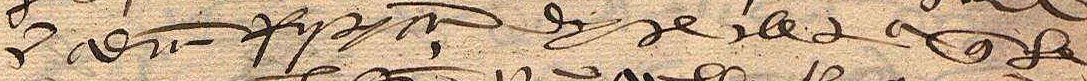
ē a dt̄a pytyçā dyse ele ta q̄ he
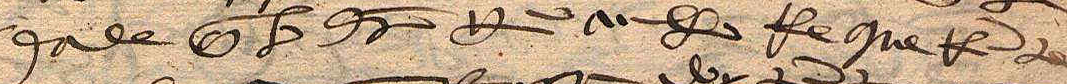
ꝟdade q̄ ho dt̄o go coelho RequeRēte
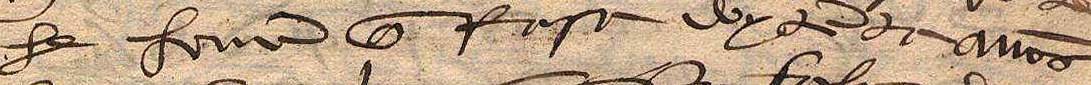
he homē q̄ pasa doytēta anōs
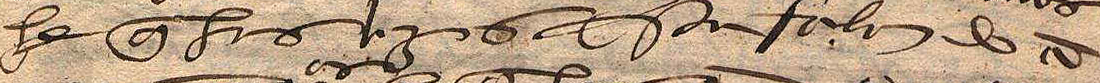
he q̄ has vezes Esta falando c̄o
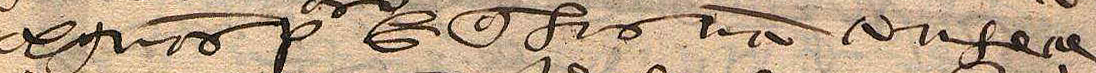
alguās pas E q̄ has n̄a conheçe
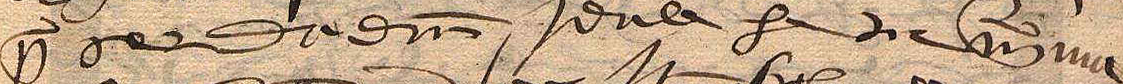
p̄o ser da dt̄a Jdade he ter mto ma
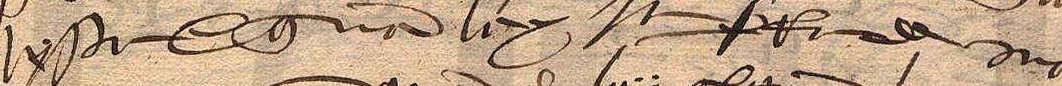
vysta e q̄ nā vay Ja foRa de sua
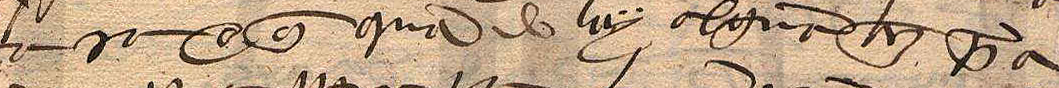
casa e q̄ quādo vay alguā vez p̄o a
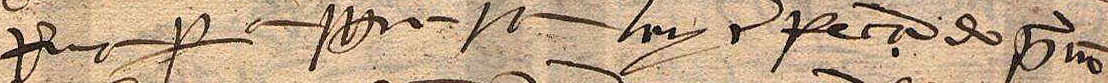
Rua ꝑ a Jgreja vay ēpeçādo p̄o nō
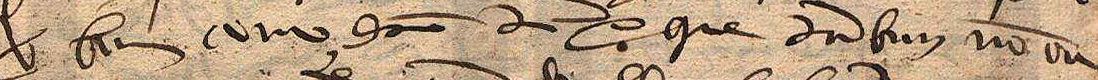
ꝟ bem como dt̄o tē e que tābem n̄o ou
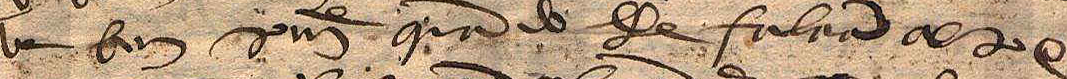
ve bem somte quādo lhe falaā alto e
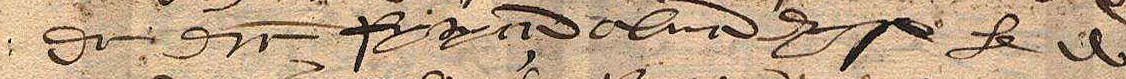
da dt̄a pytyçā al nā dyse he do
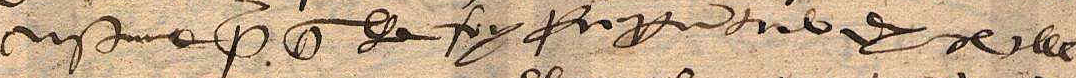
custume p̄o q̄ lhe foy pregūtado dyse elle
